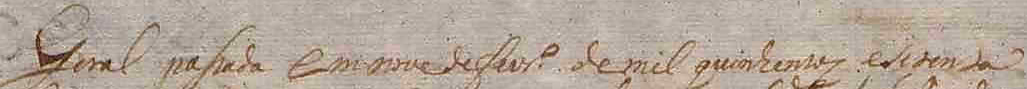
Geral passada em noue de feur.o de mil quinhentos, e setenta
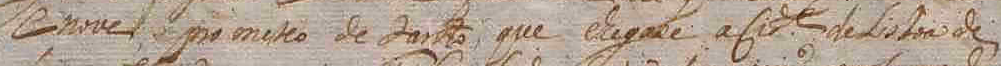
E nove, prometeo de tantto, que chegase a Cid.e de Lisboa de
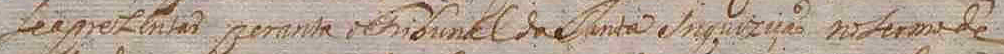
se aprezentar perante o Tribunal da Santa Inquiziçaõ no termo de
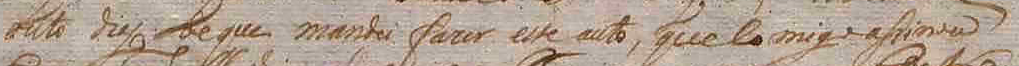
outo dias de que mandei fazer este auto, que Comigo assinou
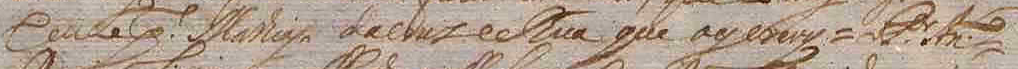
E eu o p.e Mathias da cruz e Rua que o escrevy= P.er An.to
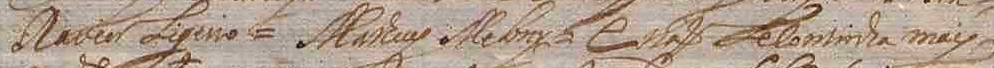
Xavier Ligerio= Matheus Melony E naõ Se Continha mais
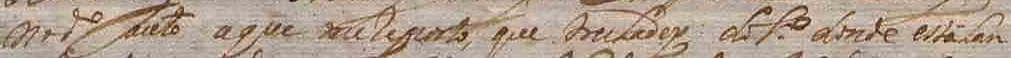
no d.o auto a que me Reporto, que tresladey do L.o donde está Lan
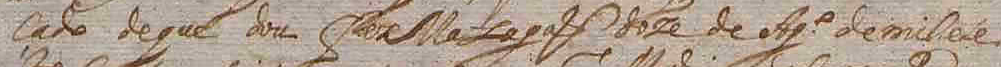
çado de que dou fee Mazagaõ doze de Ag.o de mil e se
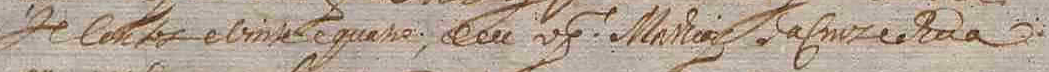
te Centos e vinte e quatro; e eu o p.e Mathias da Cruz e Rua
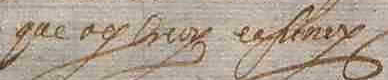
que o esCrevy e assiney
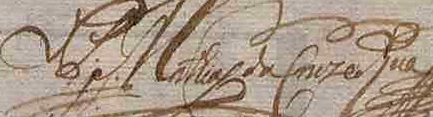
o P.e Mathias da Cruz e Rua
